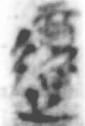○（復）
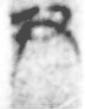尹
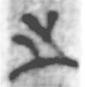之
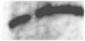一
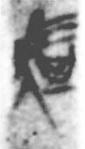騏
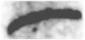一
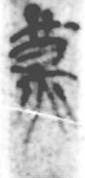黃
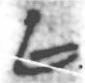㠯（以）
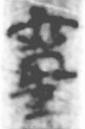𨍱（乘）
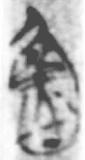魯
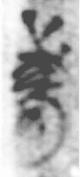○（陽）
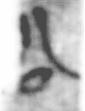公
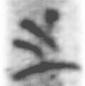之
